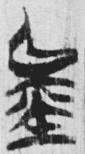舜
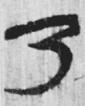乃
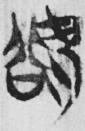欲
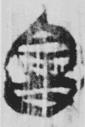會
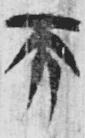天
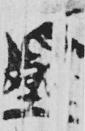○（地）
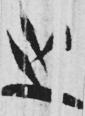之
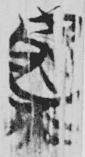○（氣）
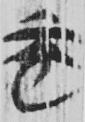而
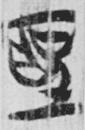聖（聽）
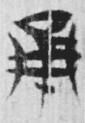甬（用）
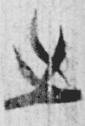之
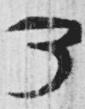乃
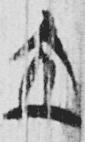立
